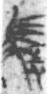馭（御）
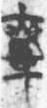𨍱（乘）
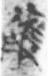雘
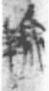輪
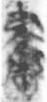○（畫）
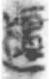○（轅）
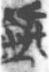○（鎋）
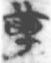革
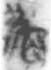弼
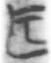○（圓）
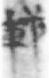軒
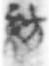紡
